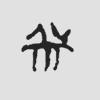{化示}
